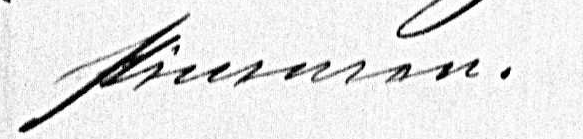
stimmen.
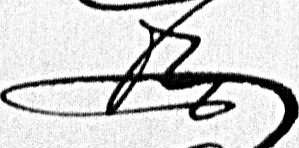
FJ
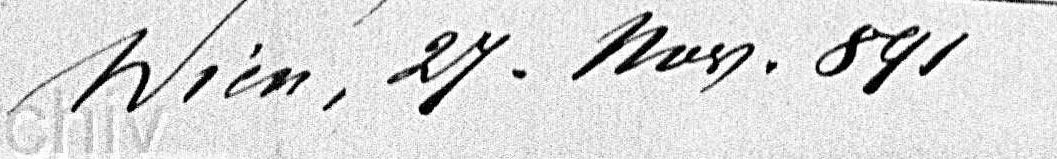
Wien, 27. Nov. 1891
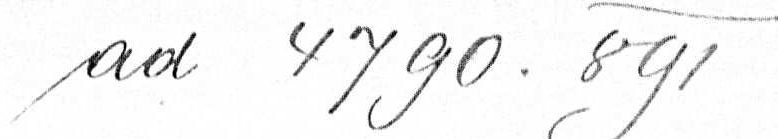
ad 4790 1891
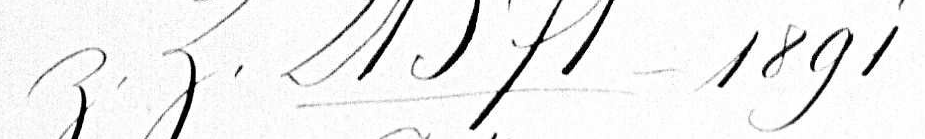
Z. 21371/ 1891
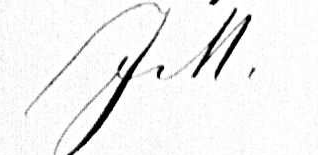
JM
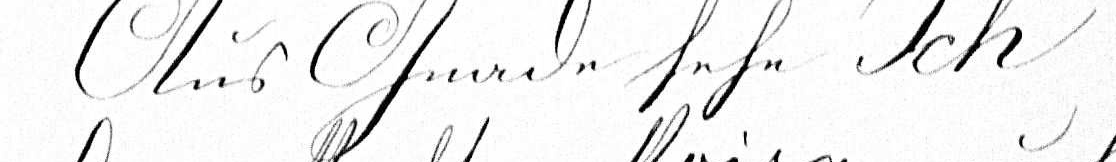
Aus Gnade sehe Ich
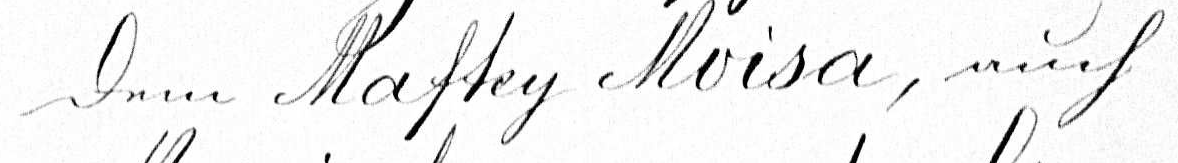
dem Maftey Moisa, auch
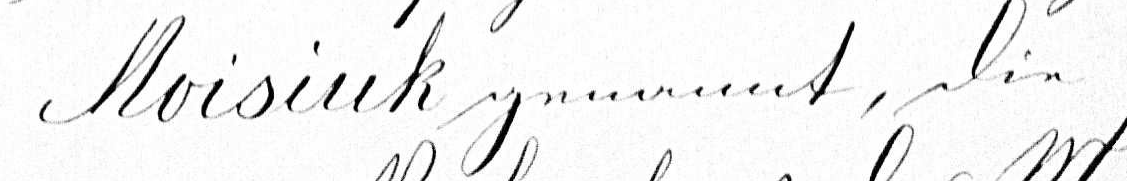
Moisiuk genannt, die
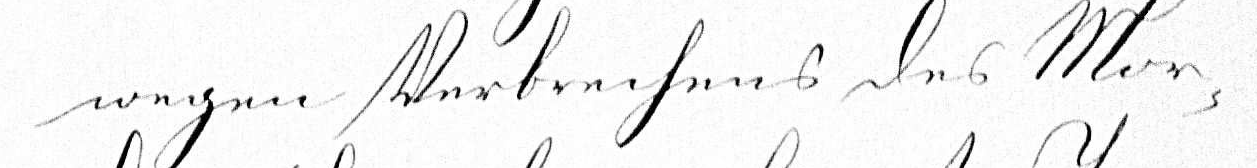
wegen Verbrechens des Mor¬
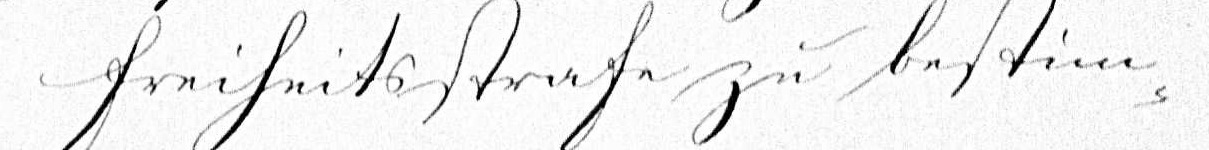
Freiheitsstrafen zu bestim¬
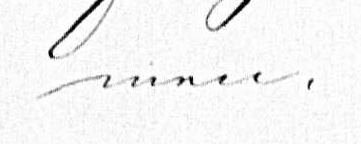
men.
